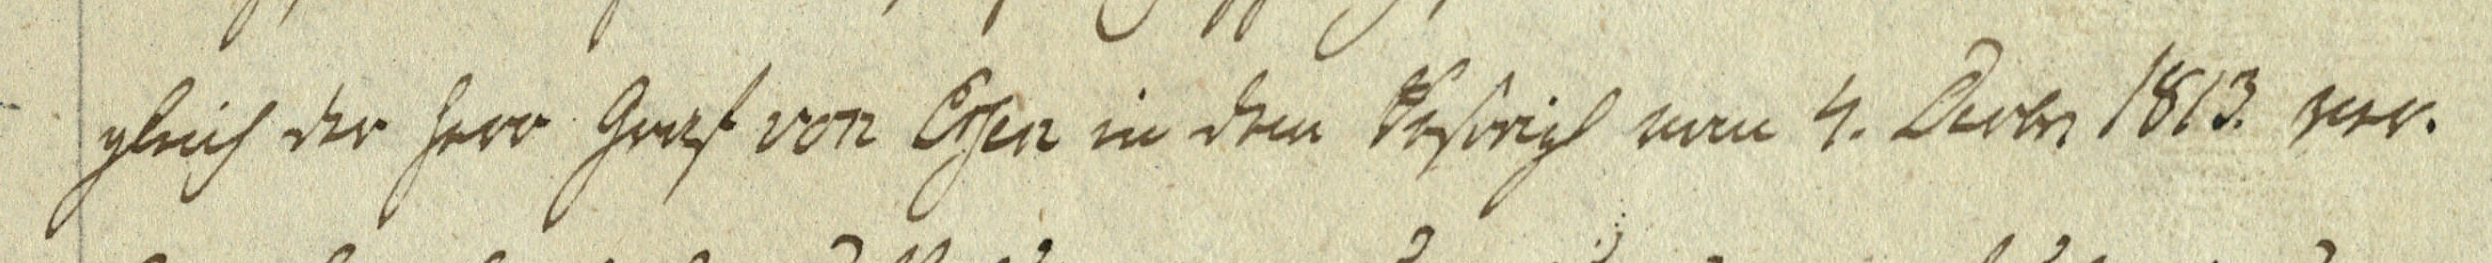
gleich der Herr Graf von Essen in dem Rescript vom 4. Decbr. 1813. ver¬
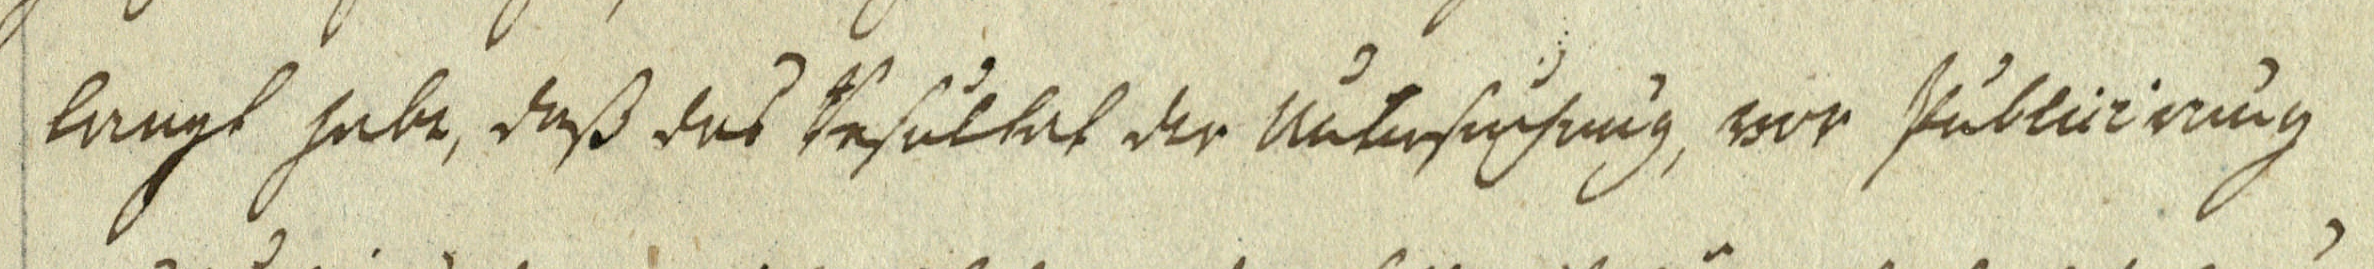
langt habe, daß das Resultat der Untersuchung, vor Publicirung
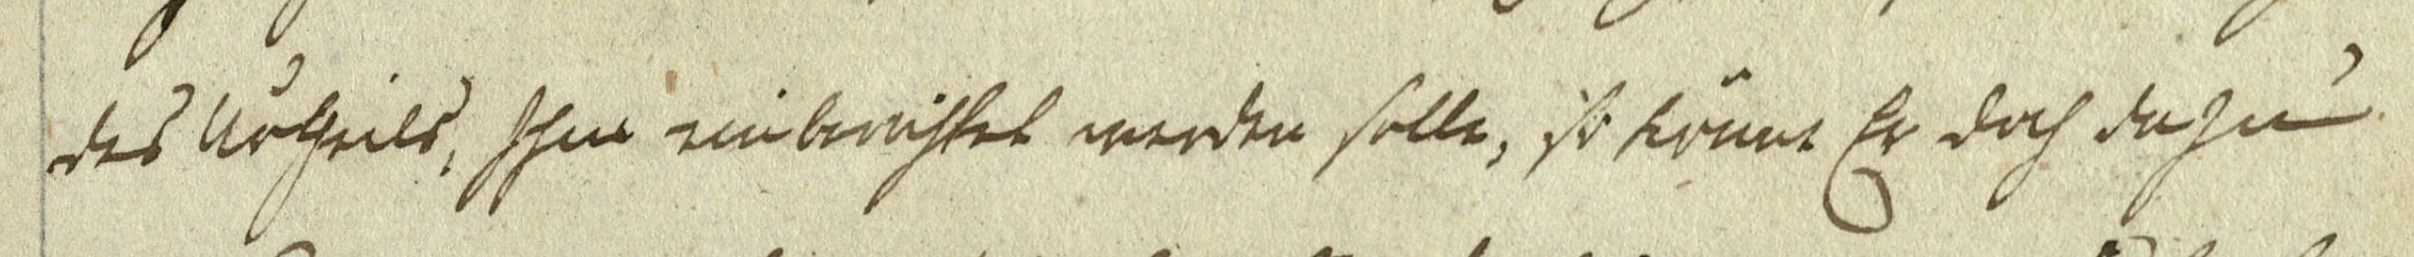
des Urtheils, Ihm einberichtet werden solle, so könne Er doch dazu
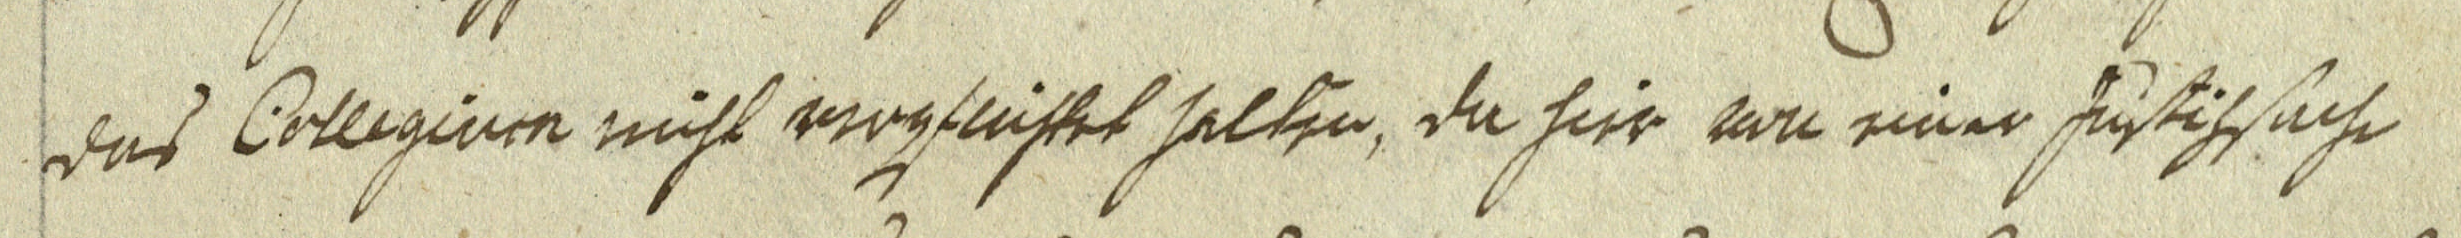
das Collegium nicht verpflichtet halten, da hier von einer Justizsache
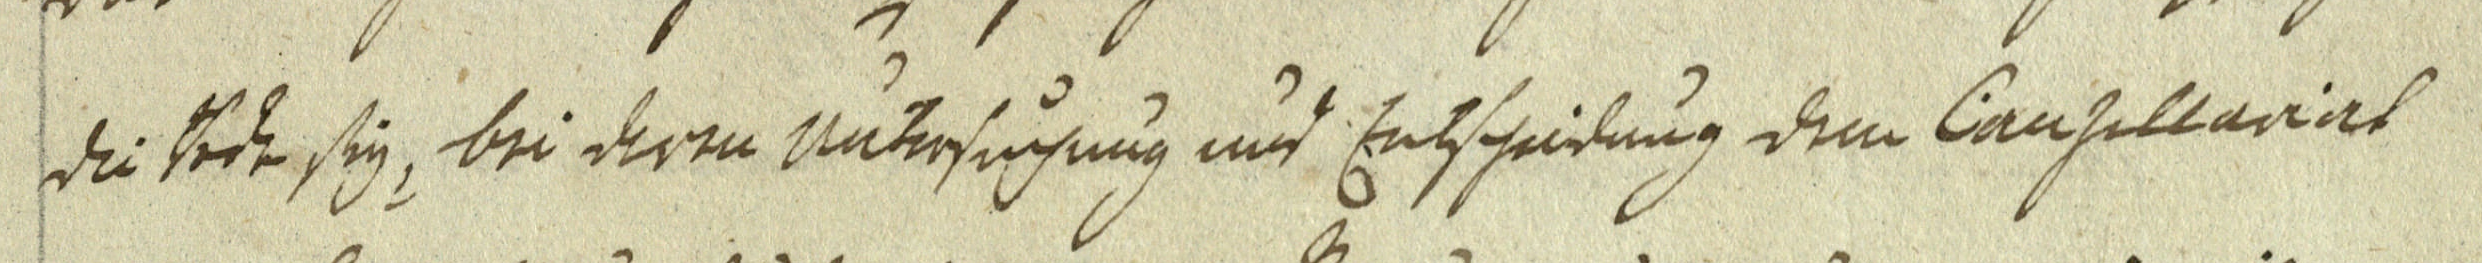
die Rede seÿ, bei deren Untersuchung und Entscheidung dem Canzellariat
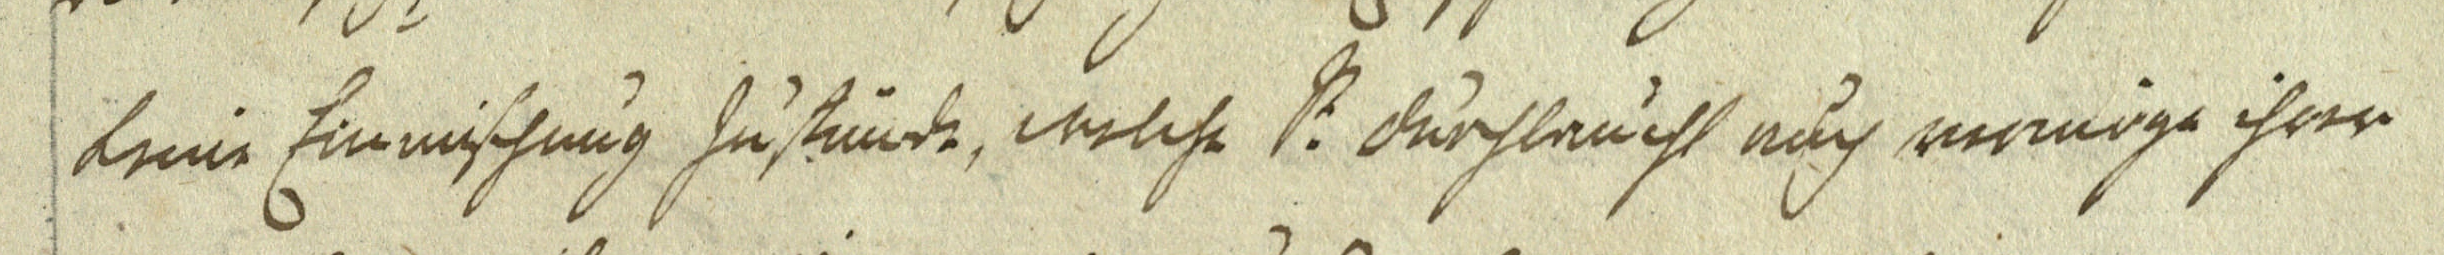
keine Einmischung zustünde, welche Sr. Durchlaucht auch vermöge ihrer
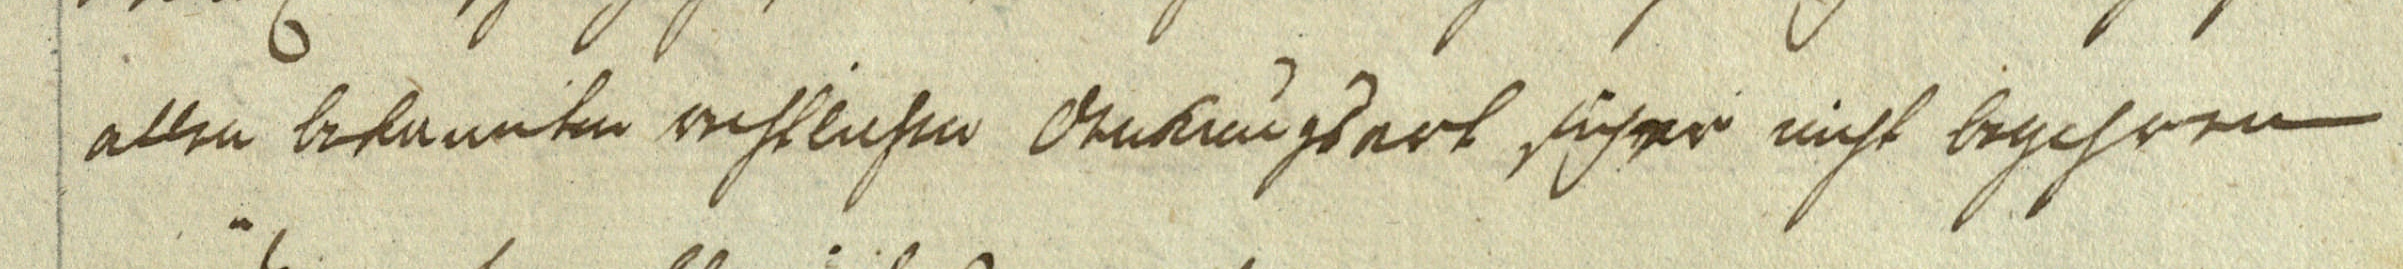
allen bekannten rechtlichen Denkungsart sicher nicht begehren
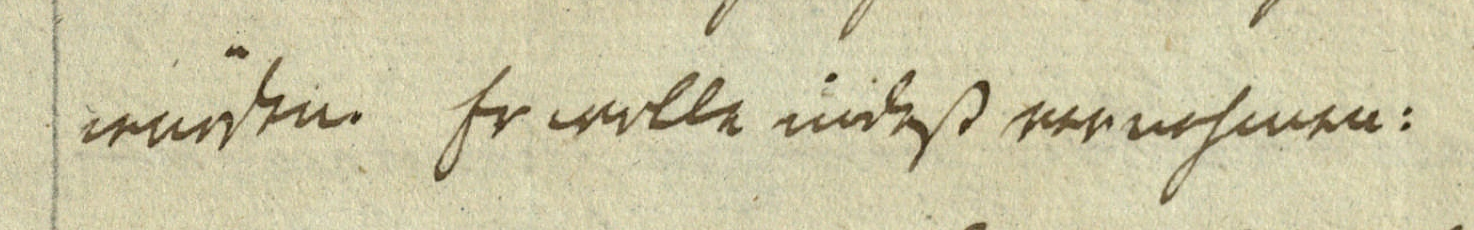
würden. Er wolle indeß vernehmen:
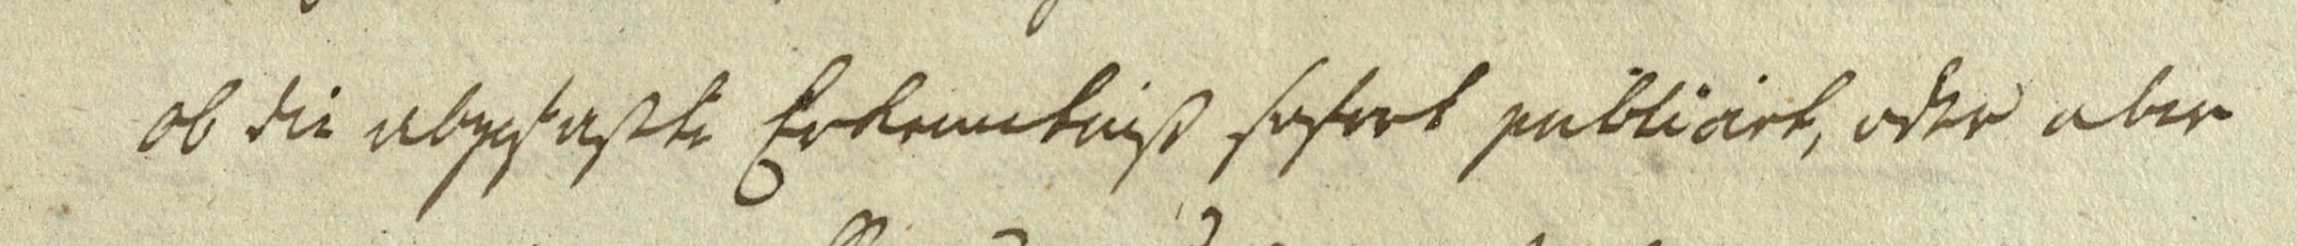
ob die abgefaßte Erkenntniß sofort publicirt, oder aber
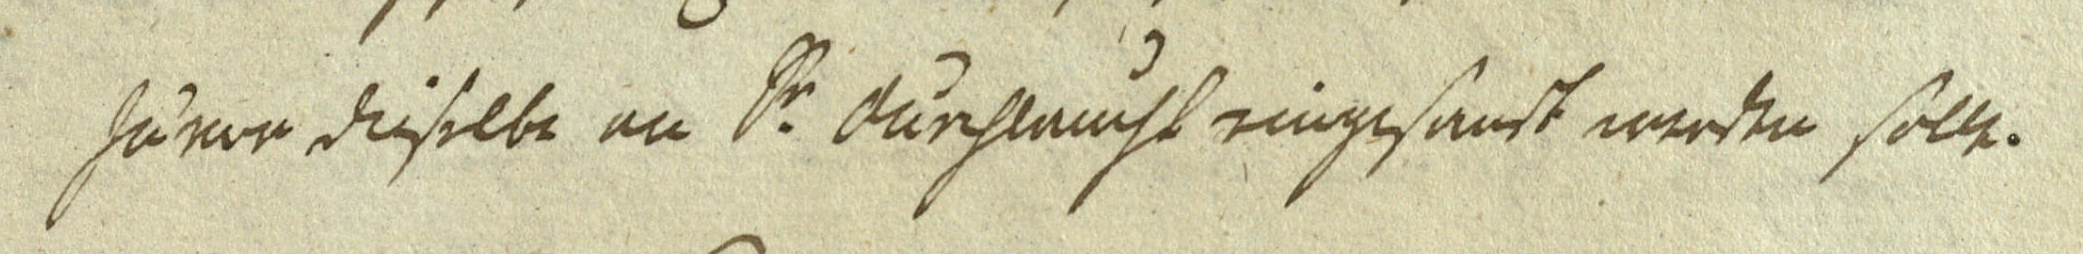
zuvor dieselbe an Sr. Durchlaucht eingesandt werden solle.
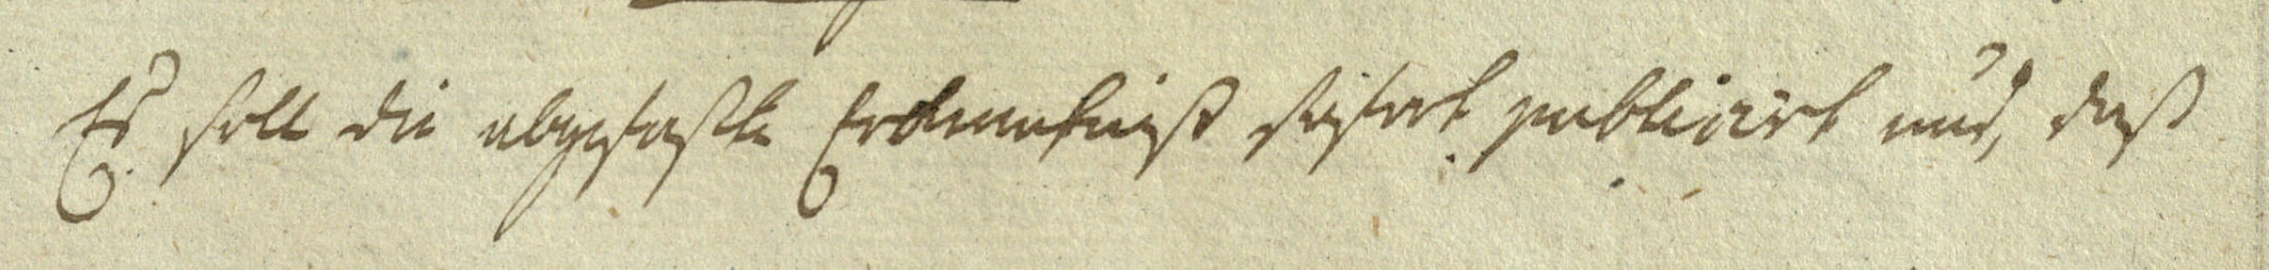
Es soll die abgefaßte Erkenntniß sofort publicirt und, daß
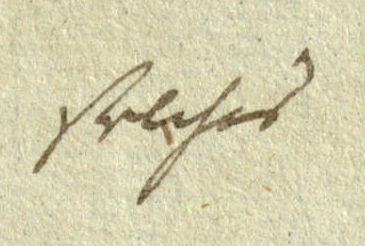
solches
